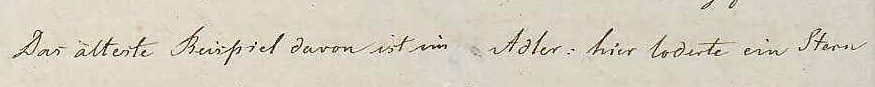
Das älteste Beispiel davon ist im Adler: hier loderte ein Stern
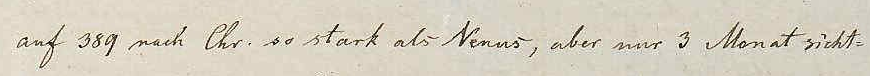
auf 389 nach Chr. so stark als Venus, aber nur 3 Monat sicht-
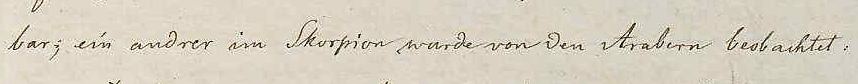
bar; ein andrer im Skorpion wurde von den Arabern beobachtet:
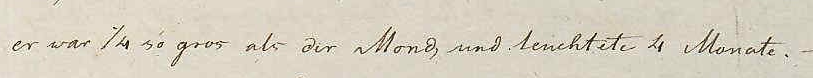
er war ¼ so gros als der Mond, und leuchtete 4 Monate. –
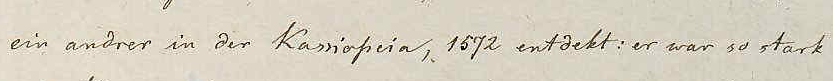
ein andrer in der Kassiopeia, 1572 entdekt: er war so stark
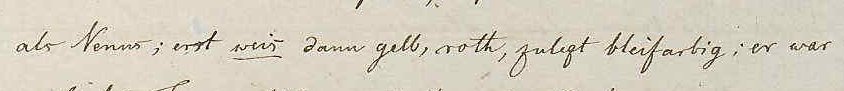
als Venus; erst weis dann gelb, roth, zulezt bleifarbig; er war
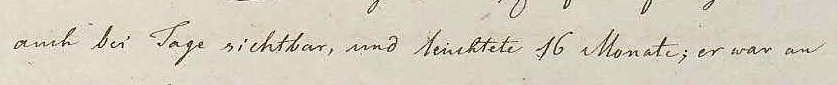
auch bei Tage sichtbar, und leuchtete 16 Monate; er war an
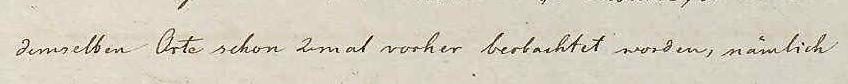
demselben Orte schon 2 mal vorher beobachtet worden, nämlich
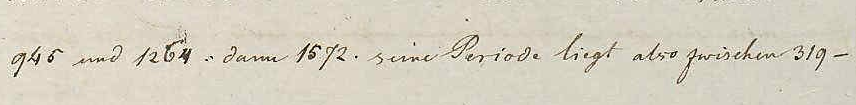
945 und 1264: dann 1572. seine Periode liegt also zwischen 319
